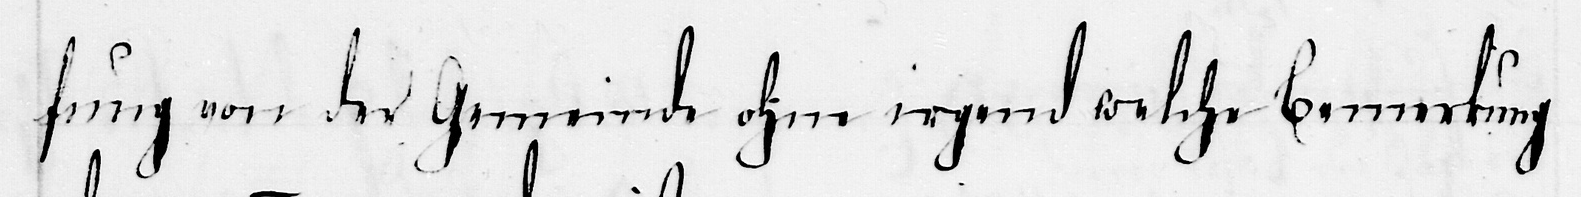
fung von der Gemeinde ohne irgend welche Bemerkung
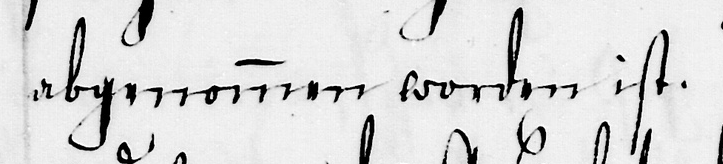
abgenommen worden ist.
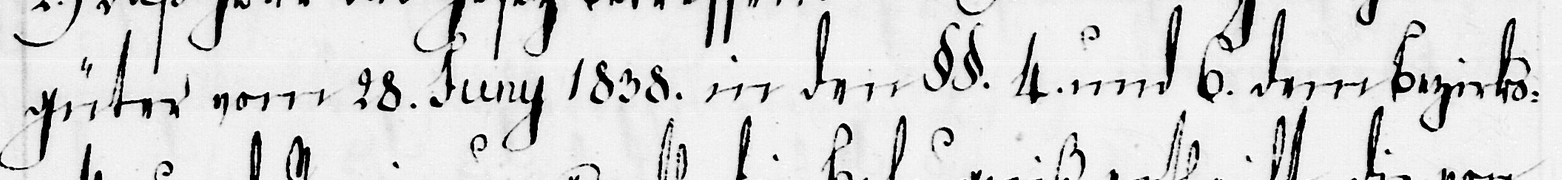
güter vom 28. Juny 1838. in den §§. 4. und 6. dem Bezirks¬
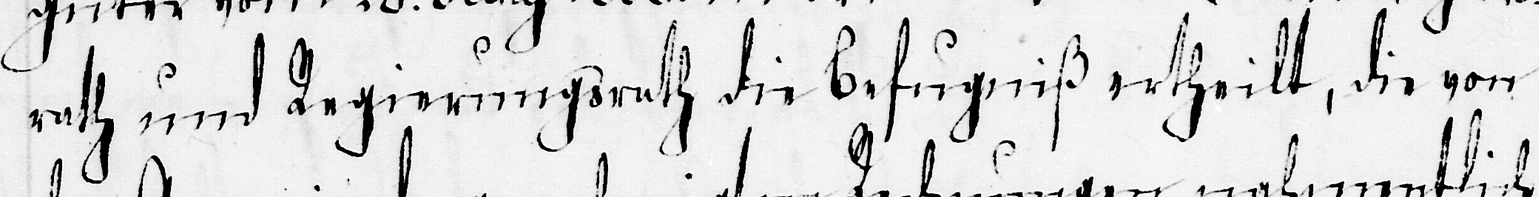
rath und Regierungsrath die Befugniß ertheilt, die von
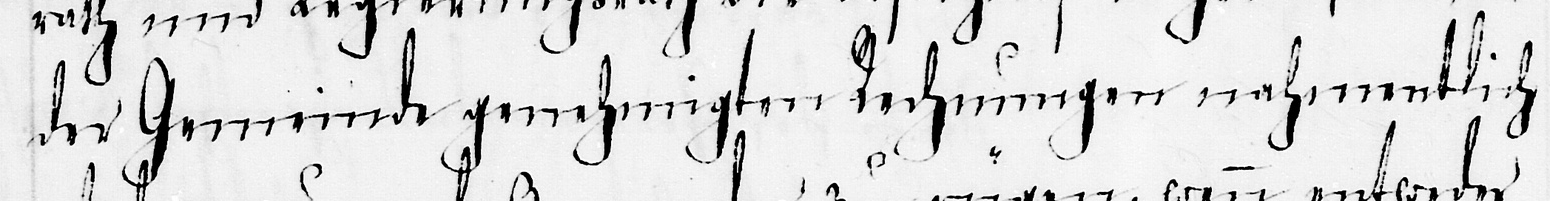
der Gemeinde genehmigten Rechnungen nahmentlich
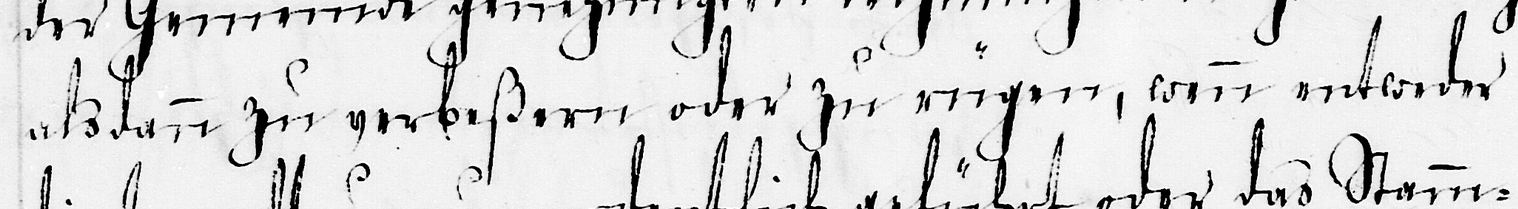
alsdann zu verbeßern oder zu rügen, wenn entweder
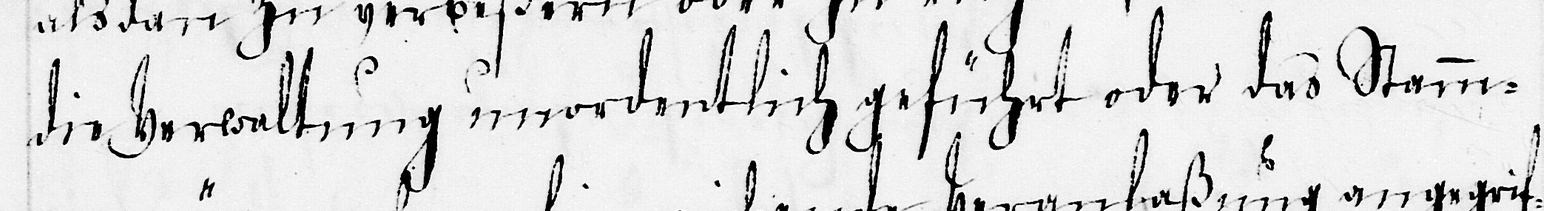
die Verwaltung unordentlich geführt oder das Stamm¬
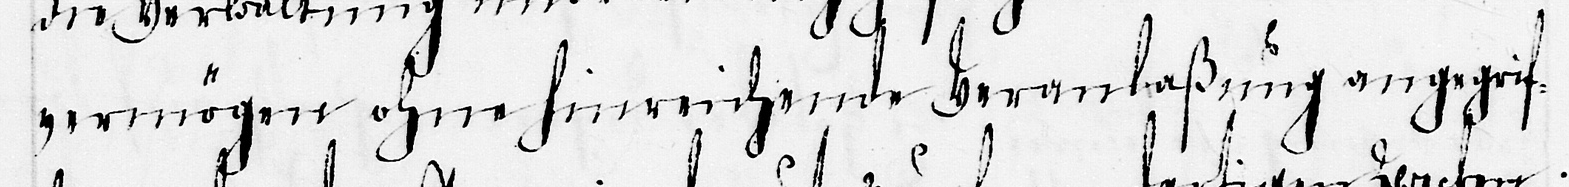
vermögen ohne hinreichende Veranlaßung angegrif¬
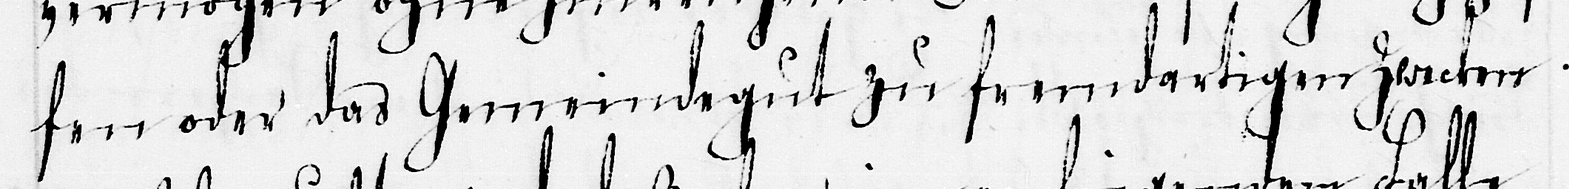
fen oder das Gemeindegut zu fremdartigen Zwecken
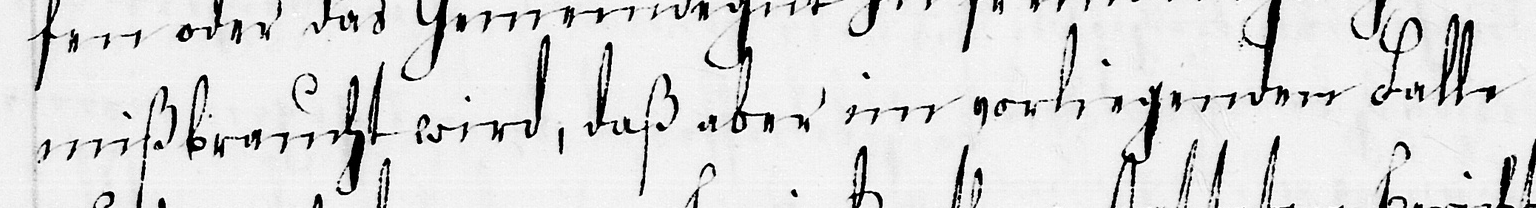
mißbraucht wird, daß aber im vorliegenden Falle
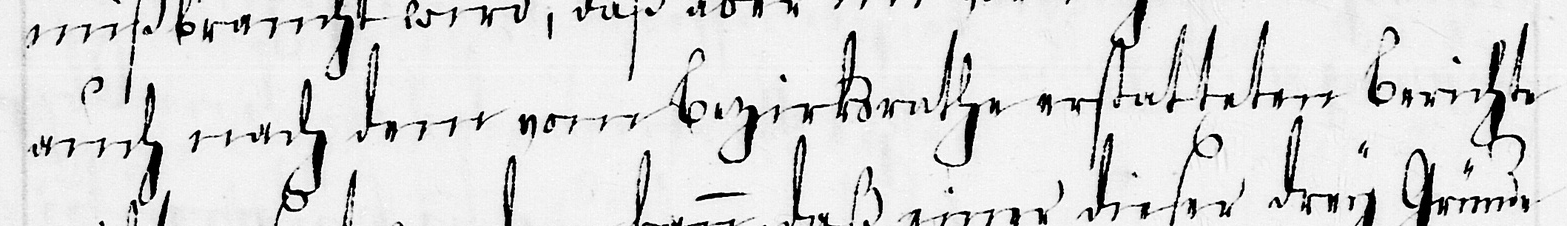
auch nach dem vom Bezirksrathe erstatteten Berichte
